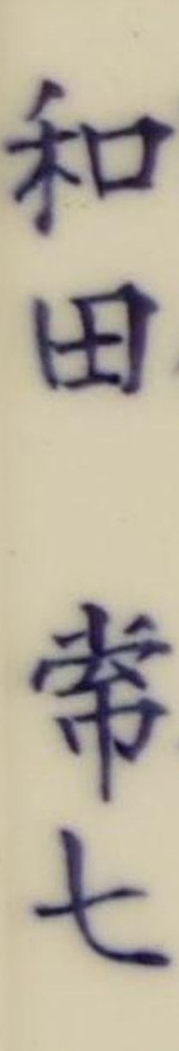和田常七

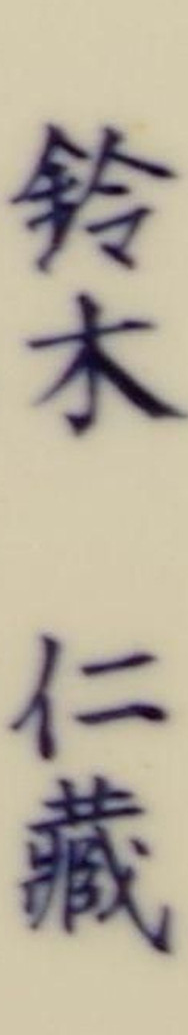鈴木仁蔵
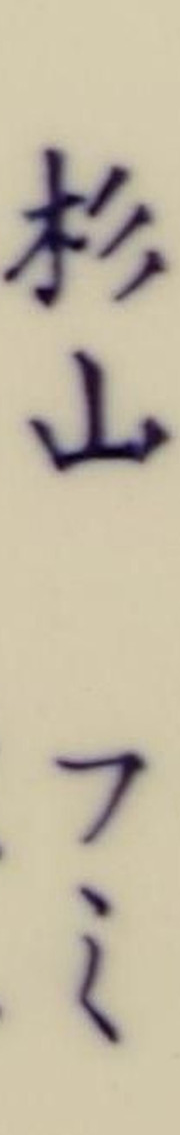杉山フミ
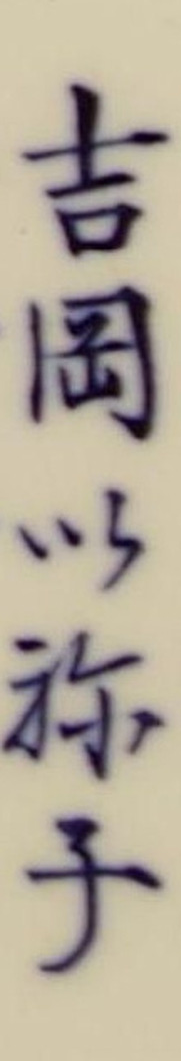吉岡以称子
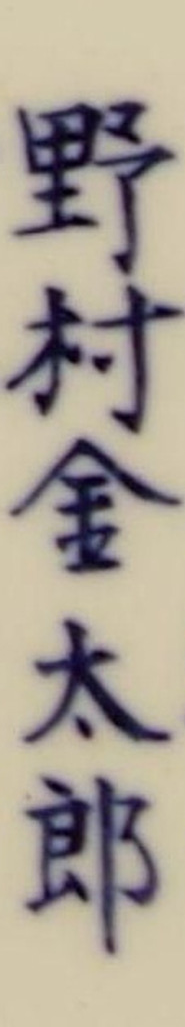野村金太郎
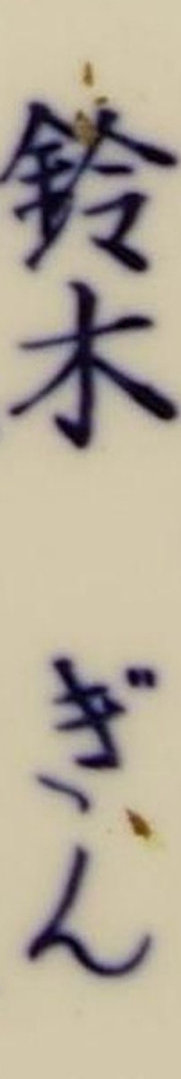鈴木ぎん
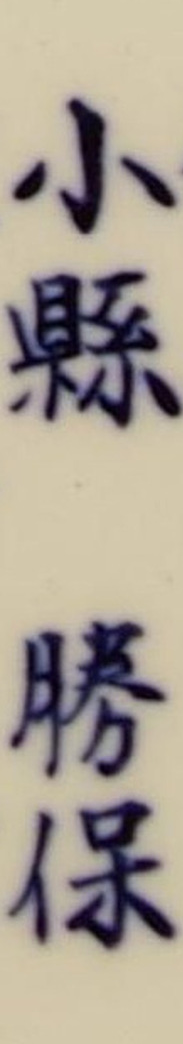小縣勝保
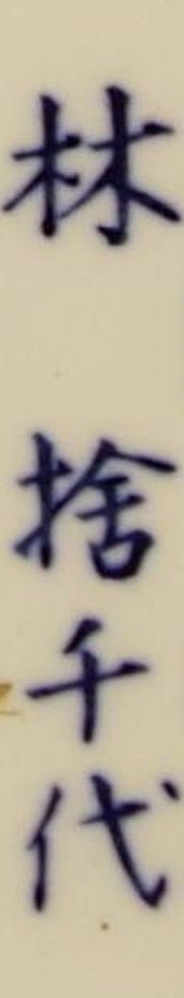林捨千代
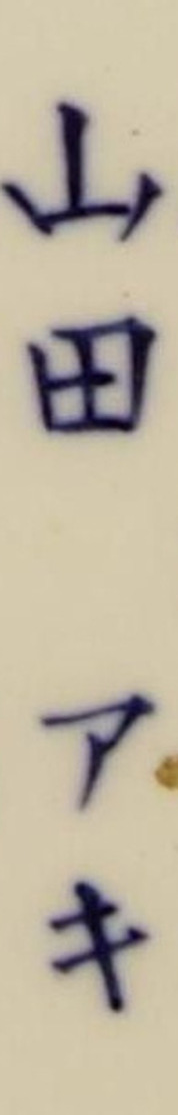山田アキ
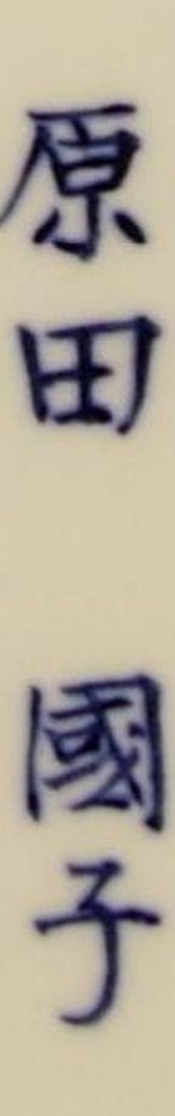原田國子
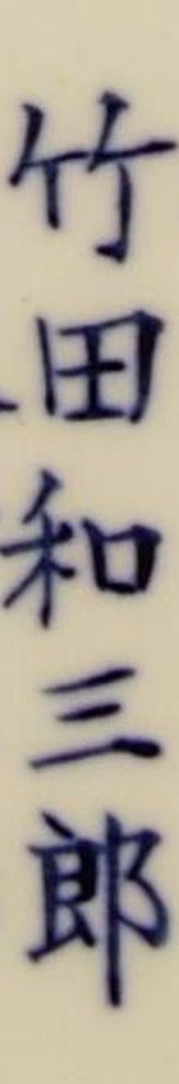竹田和三郎
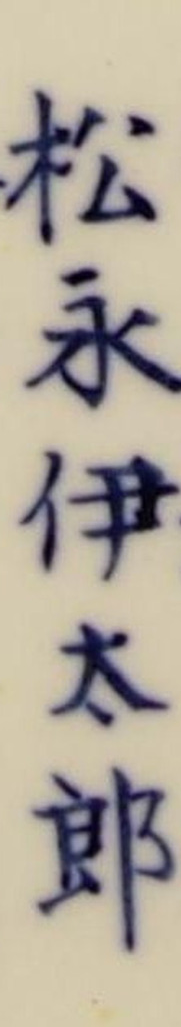松永伊太郎
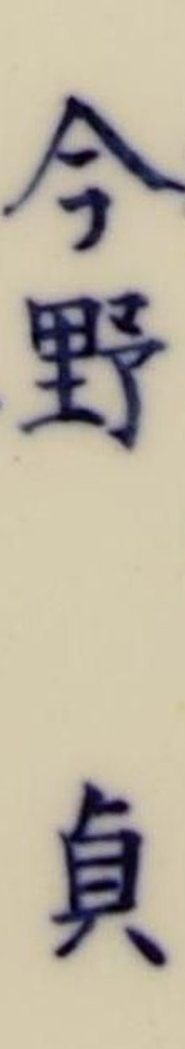今野貞
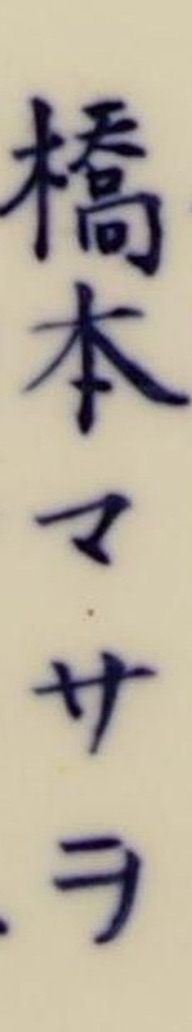橋本マサヲ
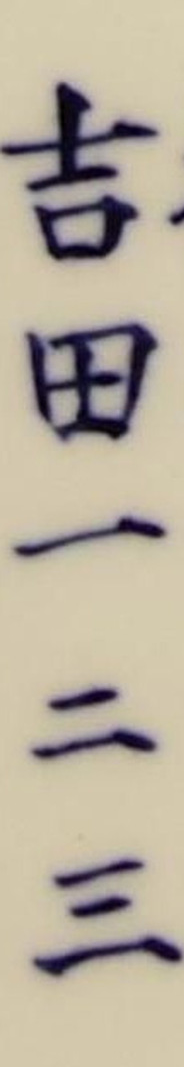吉田一二三
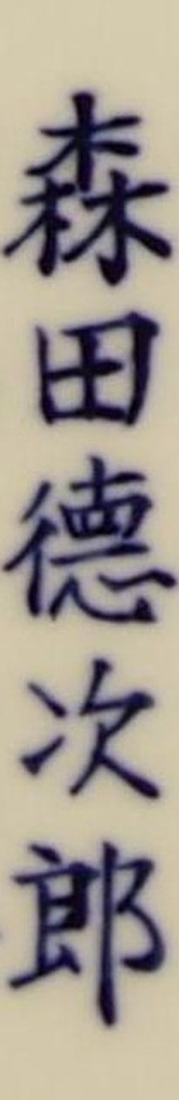森田徳次郎
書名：E~L
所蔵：高野山金剛峯寺
